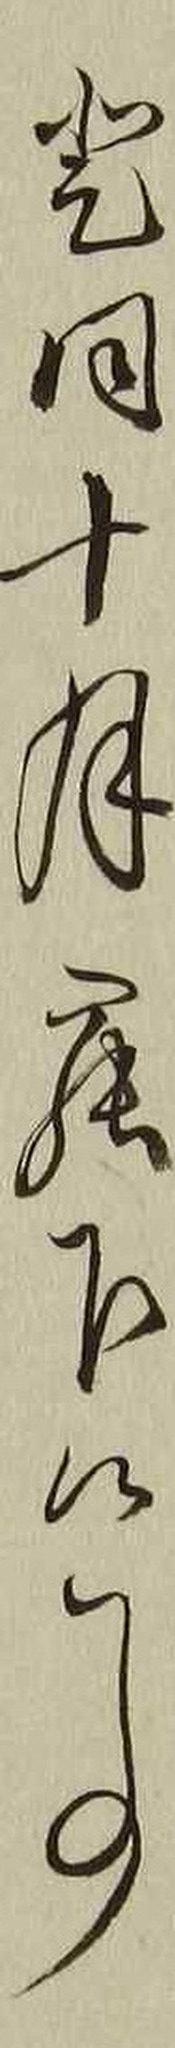登同十月罷下候事
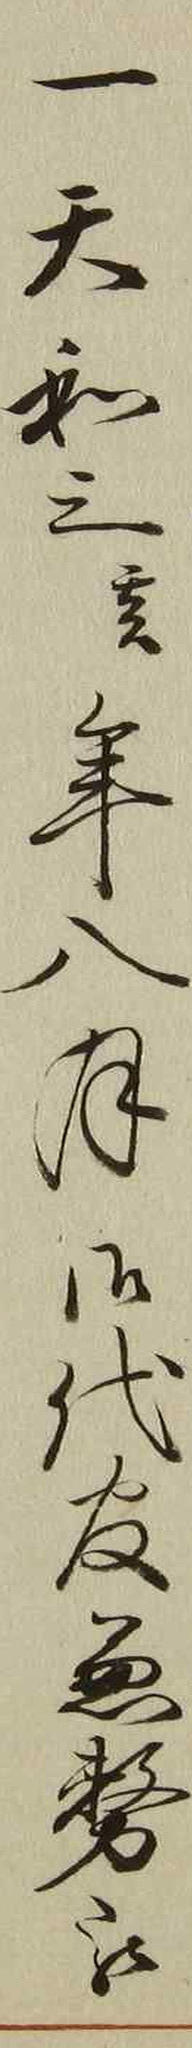一天和三亥年八月御代官兼務被
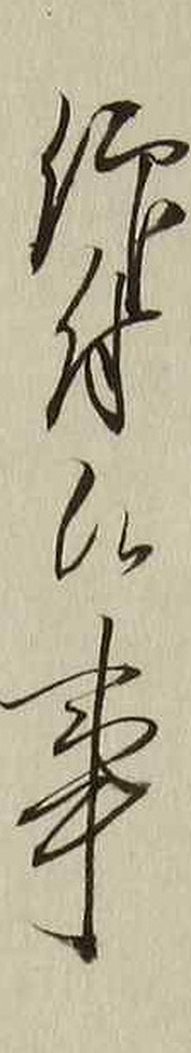仰付候事
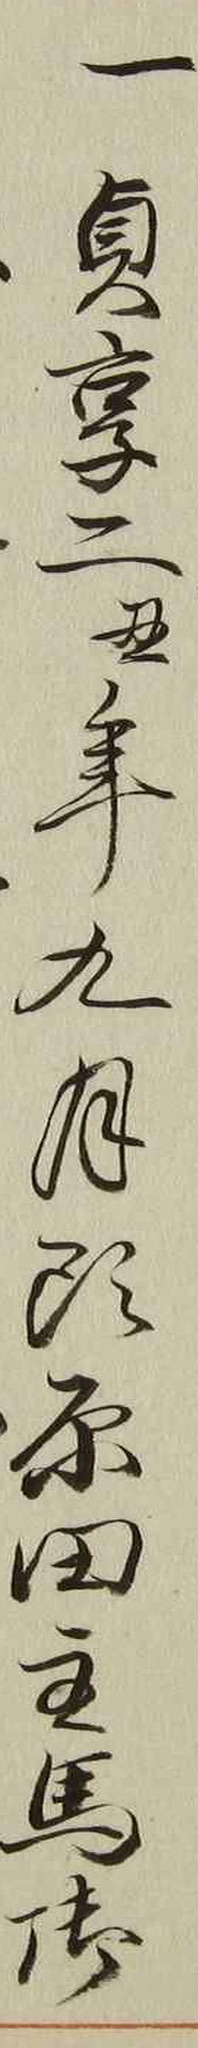一貞享二丑年九月頭原田主馬御
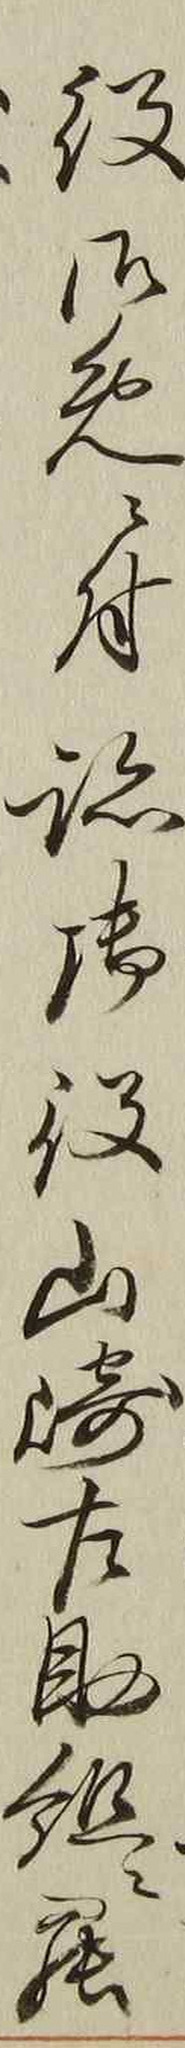役御免ニ付跡御役山崎左助組ニ罷
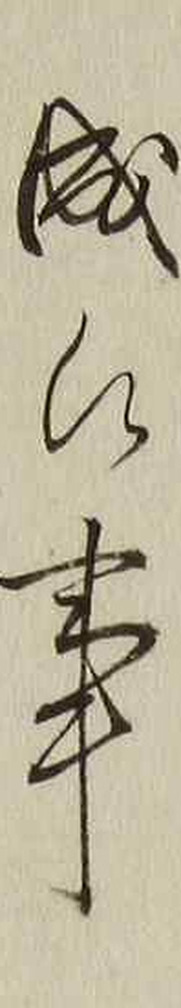成候事
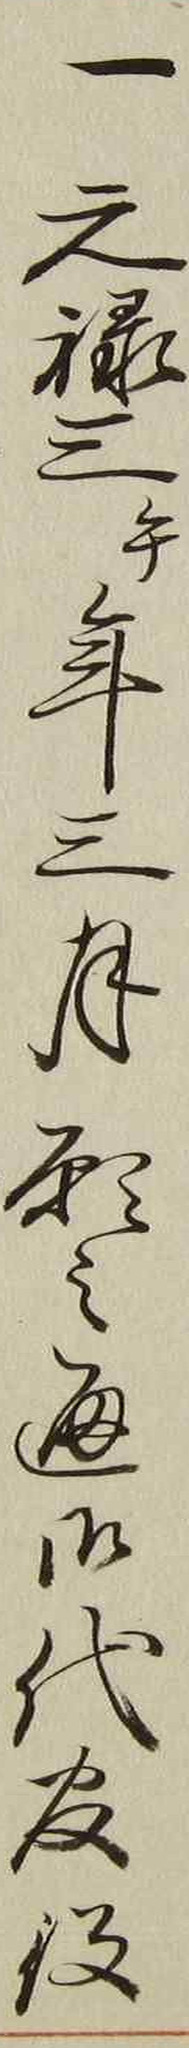一元禄三午年三月願之通御代官役
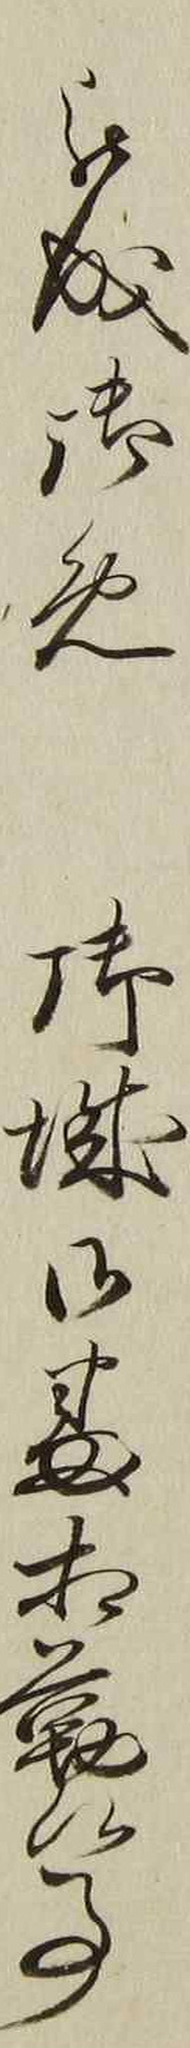被成御免御城御番相勤候事
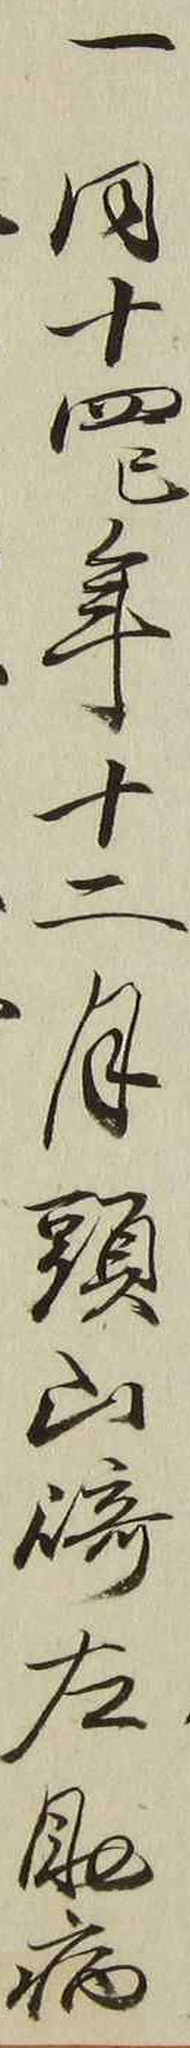一同十四巳年十二月頭山崎左助病
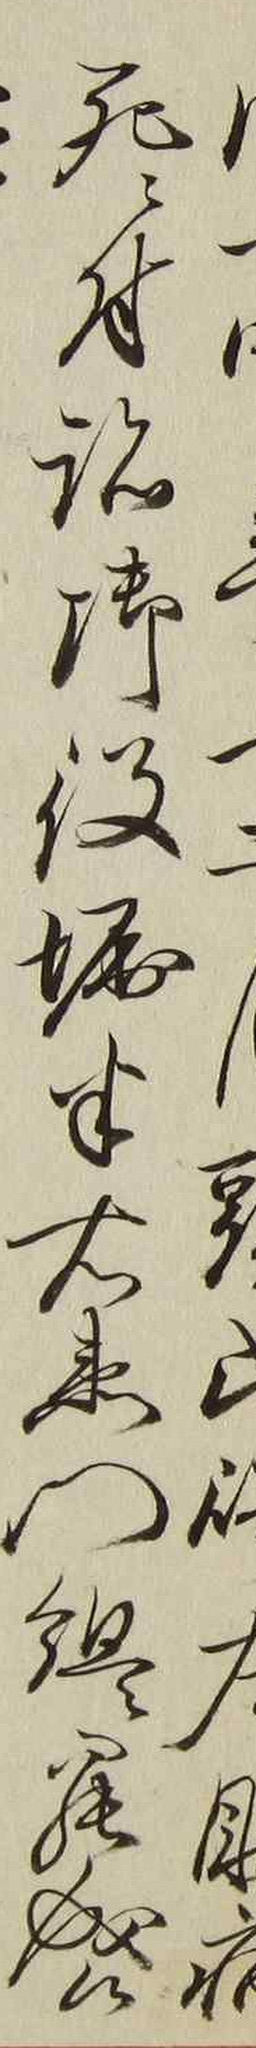死ニ付跡御役堀半右衛門組ニ罷成候
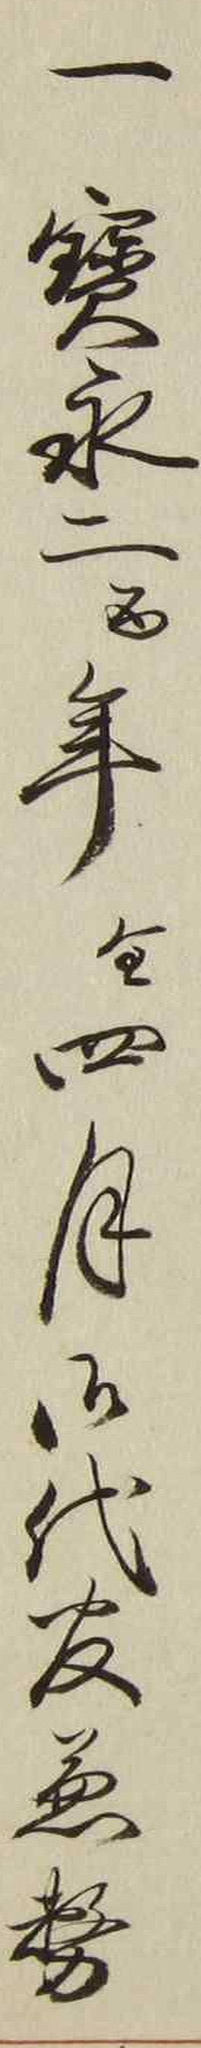一宝永二酉年閏四月御代官兼

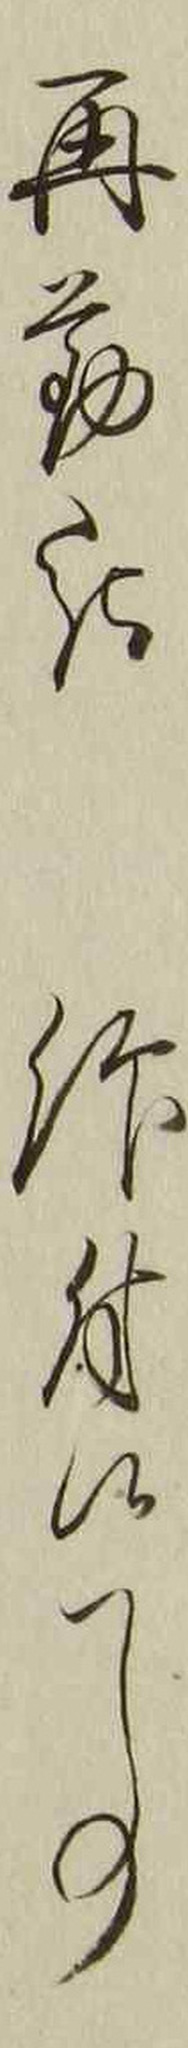再勤被仰付候事
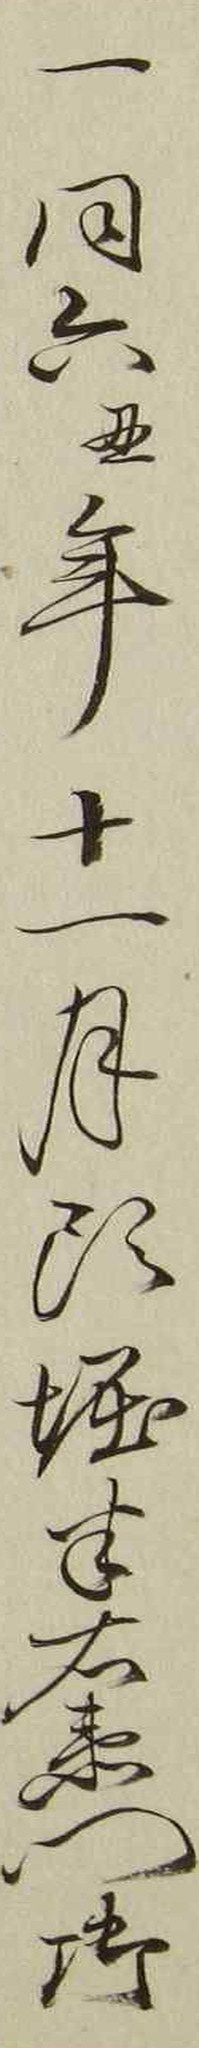一同六丑年十一月頭堀半右衛門御
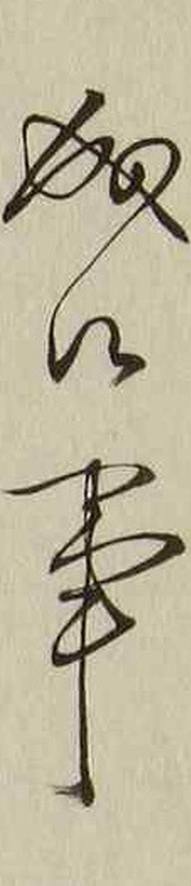成候事
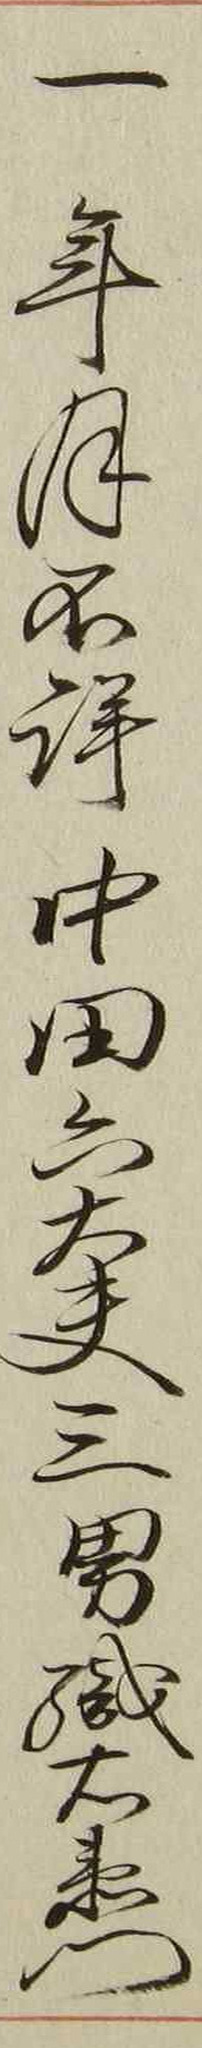一年月不詳中田六大夫三男職右衛門
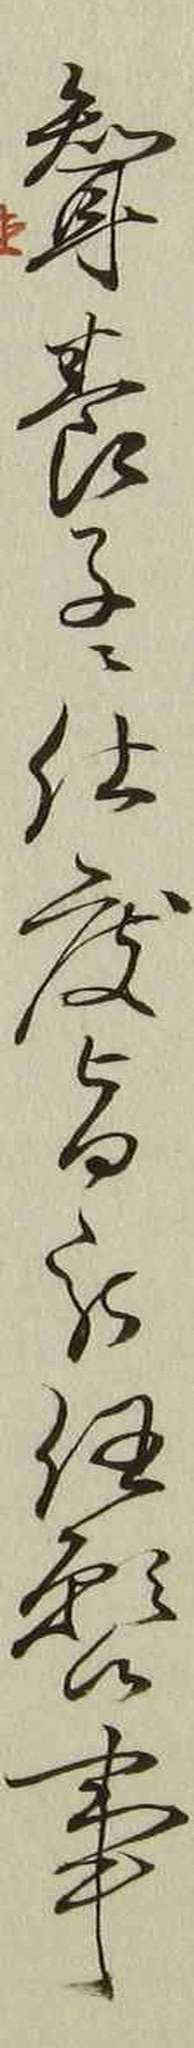聟養子ニ仕度旨被任願候事
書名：諸士系譜　巻之54　ほ之部1
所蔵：会津若松市立会津図書館
